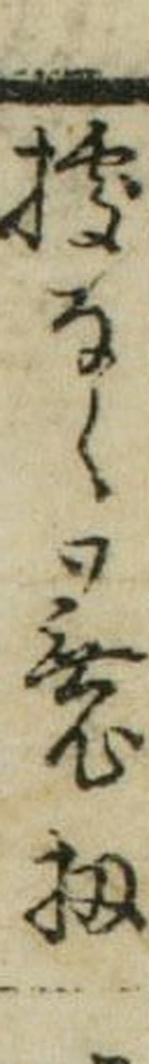拠なく御無心扨
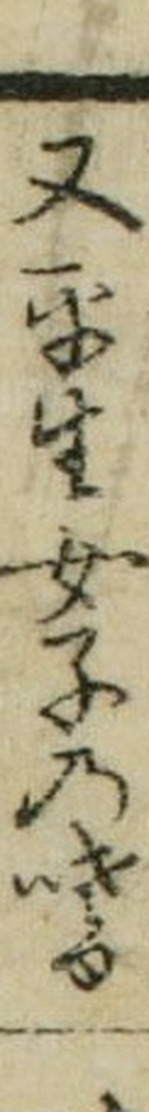又平生女子の嗜
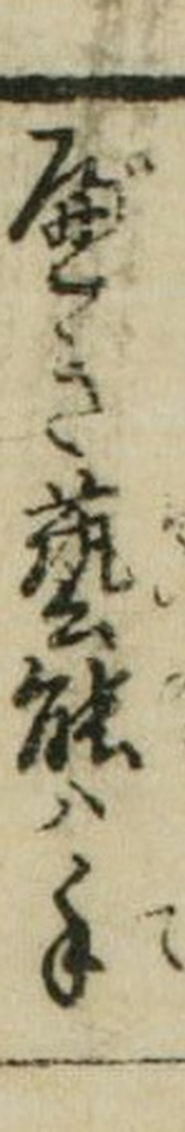べき芸能は手
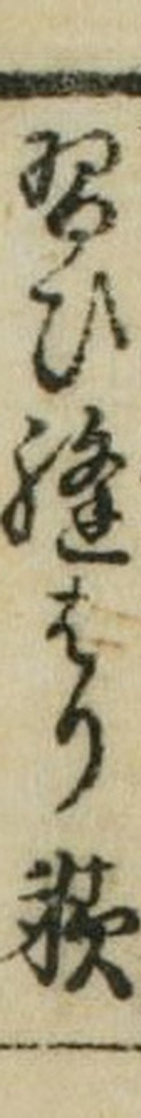習ひ縫はり躾
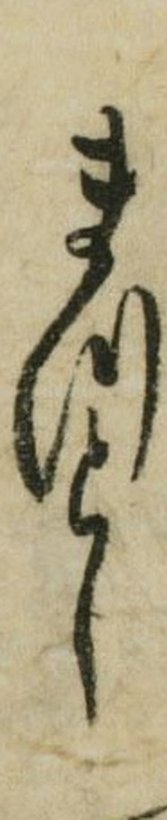まつとし
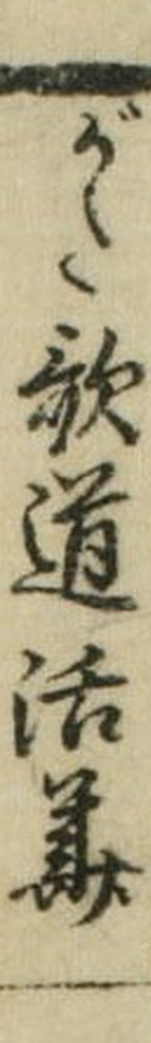がた歌道活華
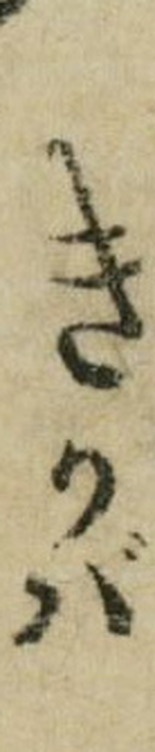きかば
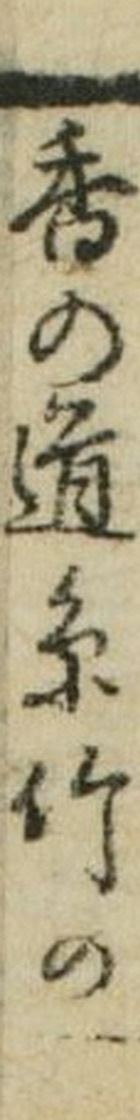香の道糸竹の
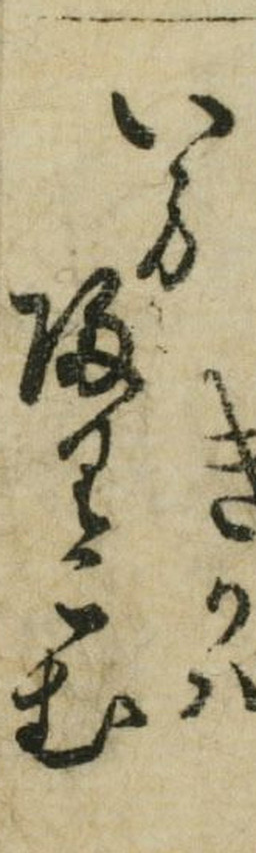帰りこむ
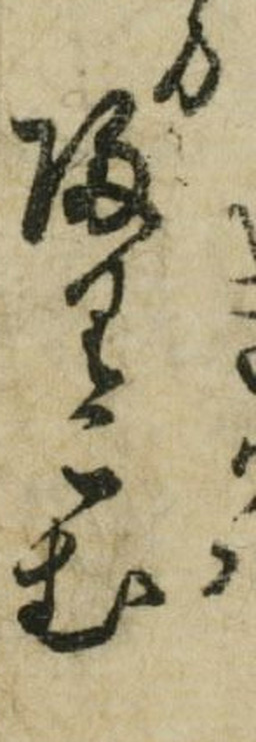帰りこむ
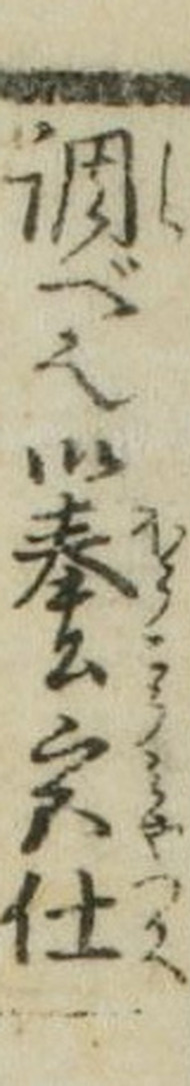調べ也御奉公宮仕
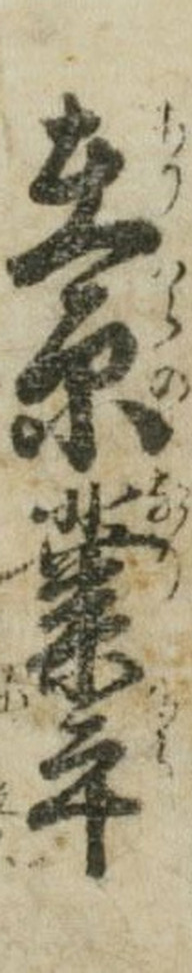在原業平
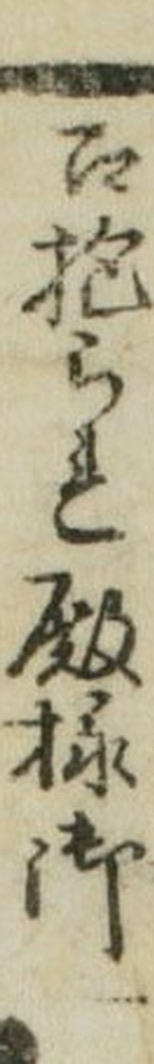召抱られ殿様御
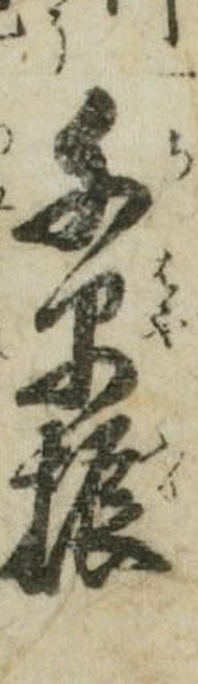千早振
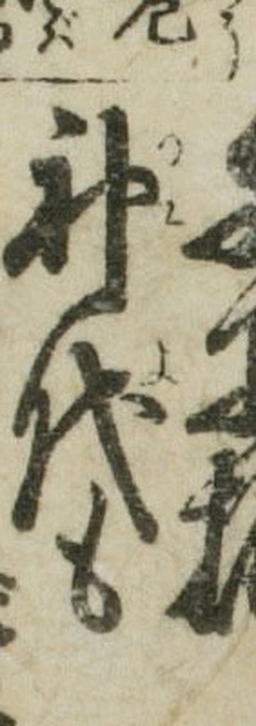神代も
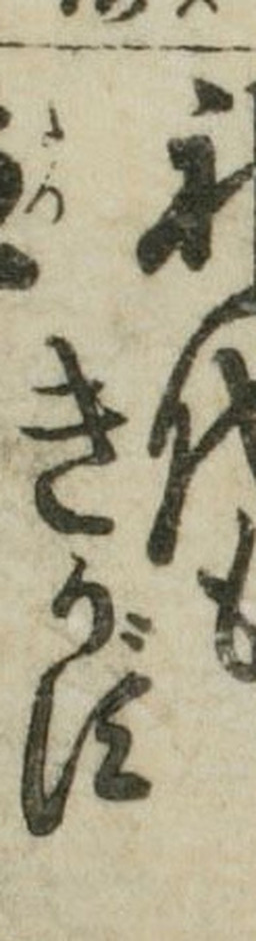きかず
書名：百人一首
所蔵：東京学芸大学教育コンテンツアーカイブ
